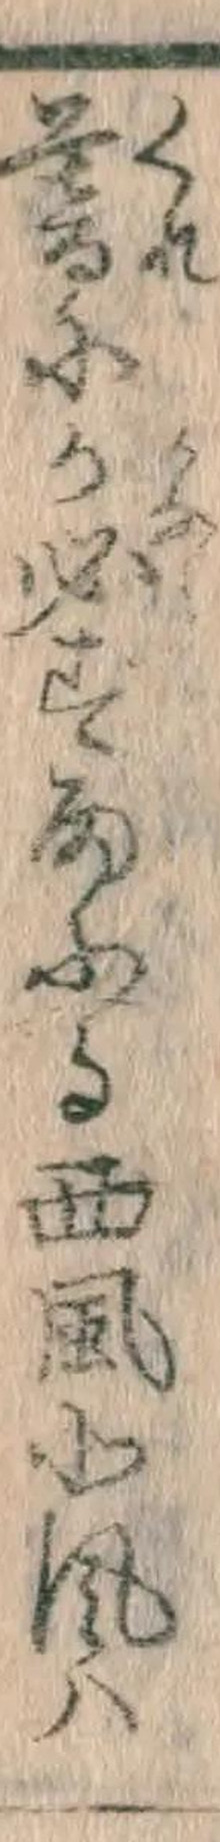暮にか必す雨ふる西風北風は
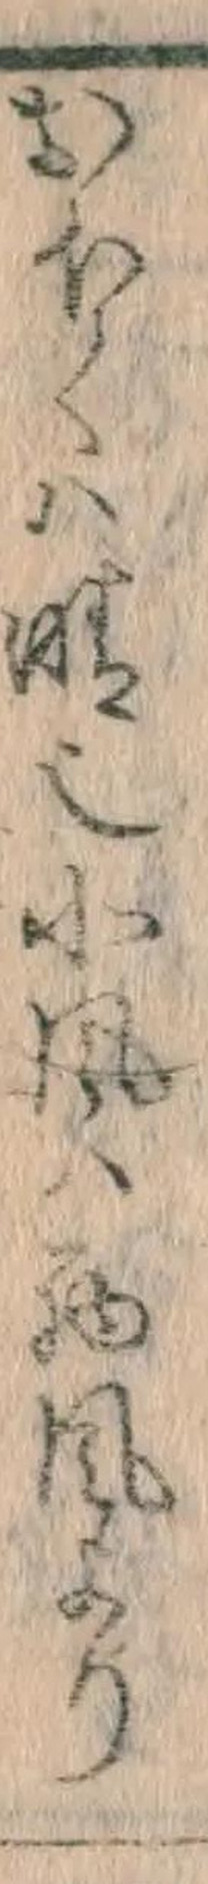おほくは晴也北風は西風より
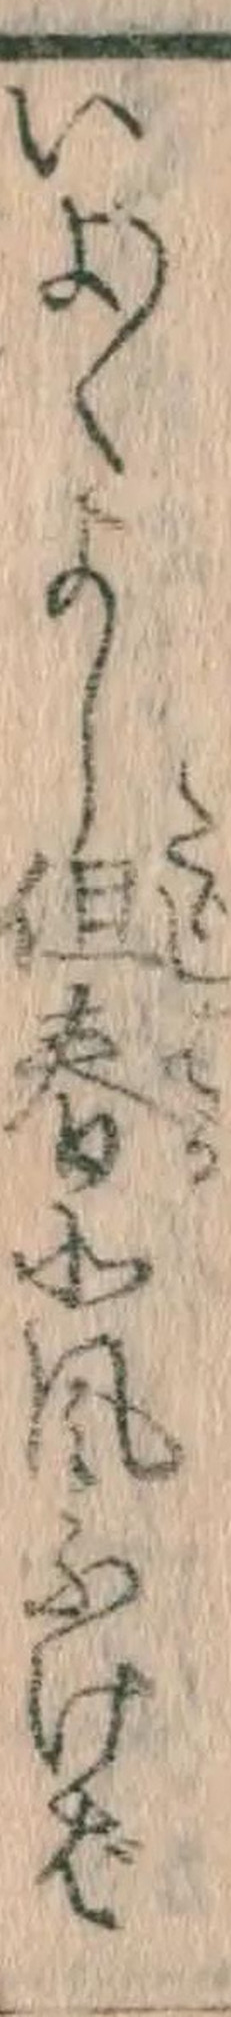いよ〳〵よし但春北風ふけば
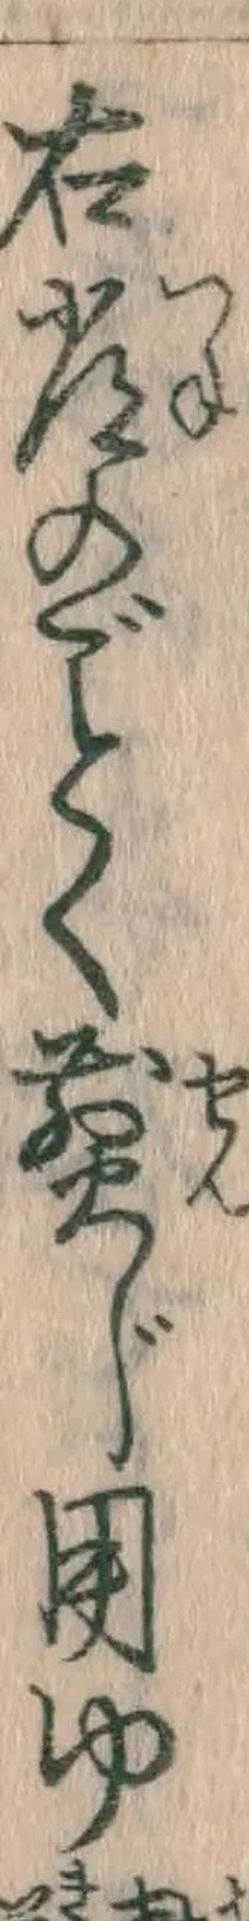右つねのごとく煎じ用ゆ
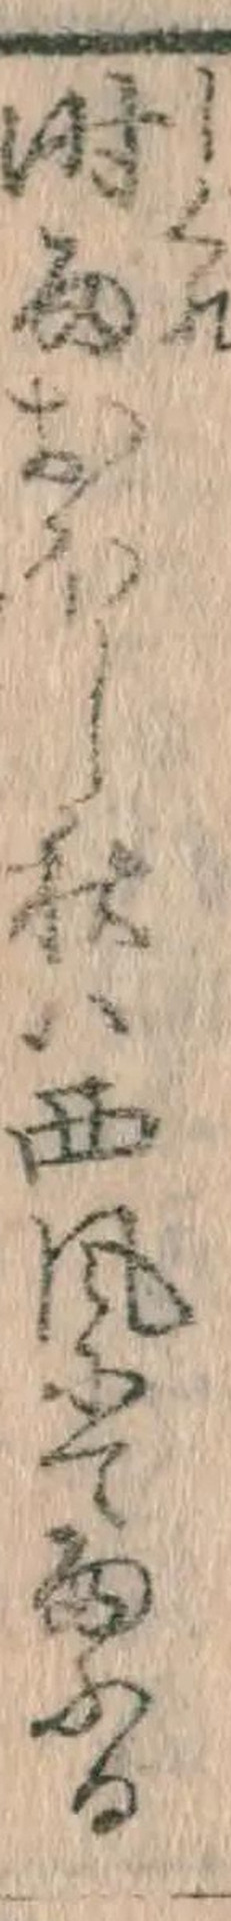時雨おほし秋は西風にて雨ふる
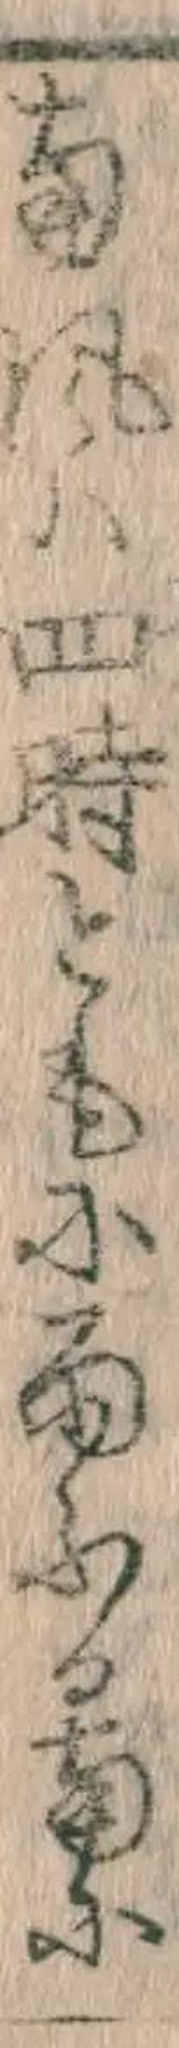南風は四時ともに雨ふる南に
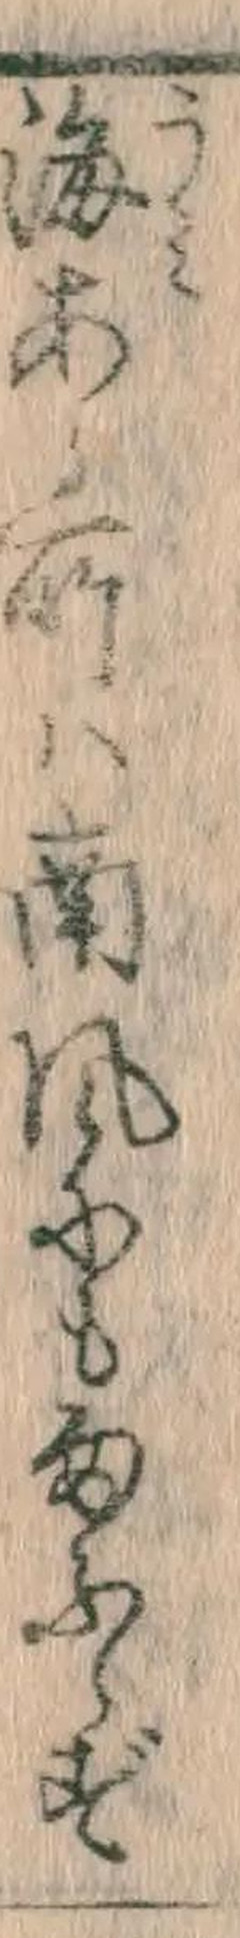海ある所は南風にも雨ふらず
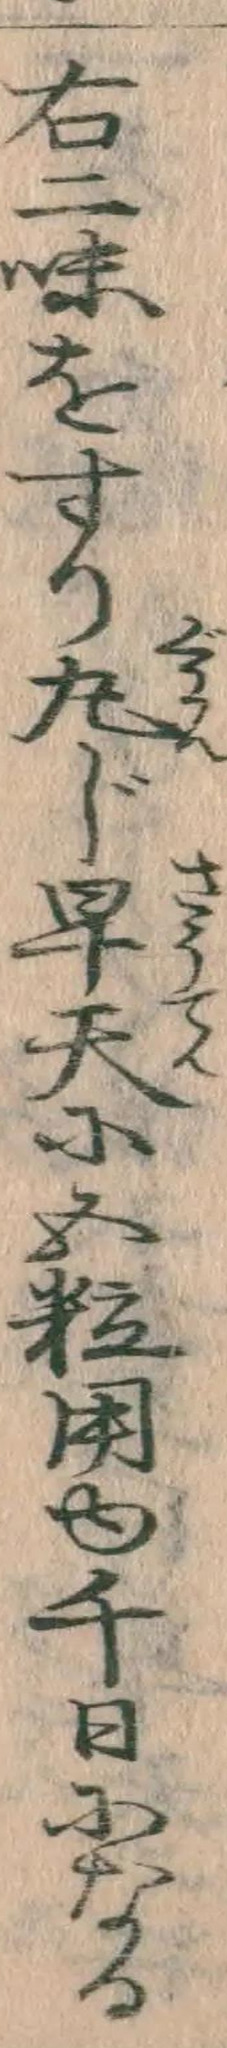右二味をすり丸じ早天に五粒用ゆ千日になる
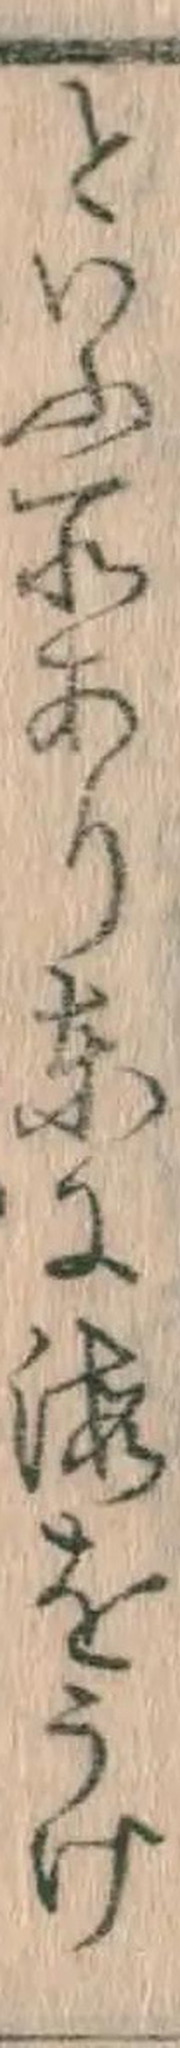といふ所あり東に海をうけ
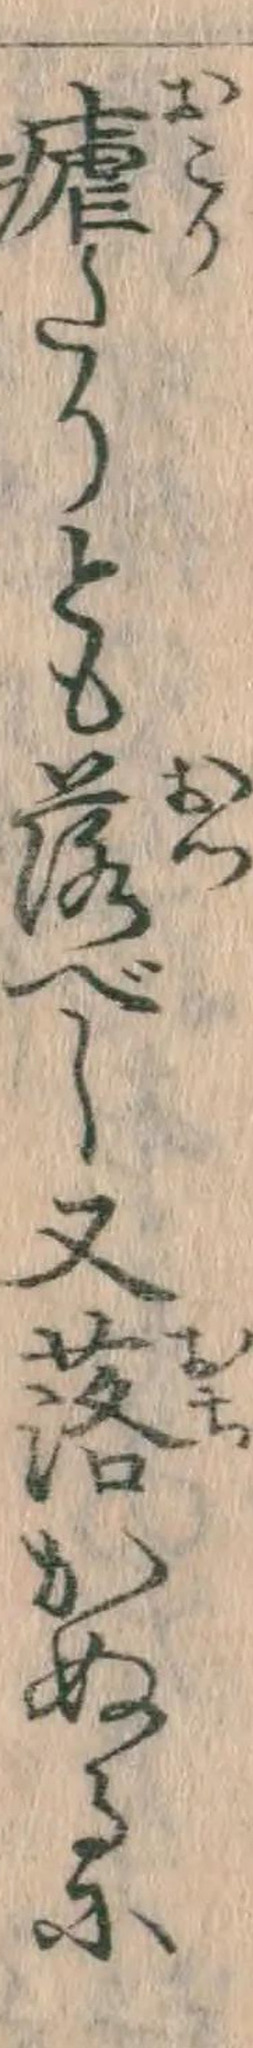瘧たりとも落べし又落かぬるに
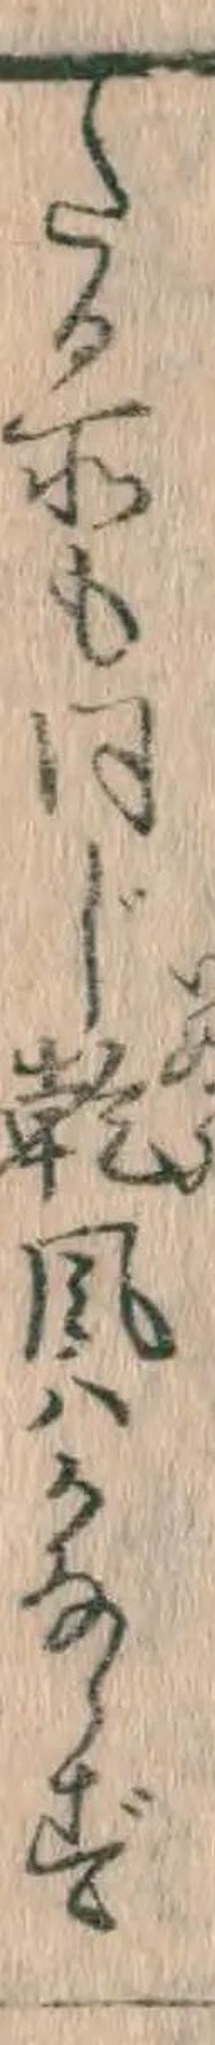たる所も同じ乾風はかならず
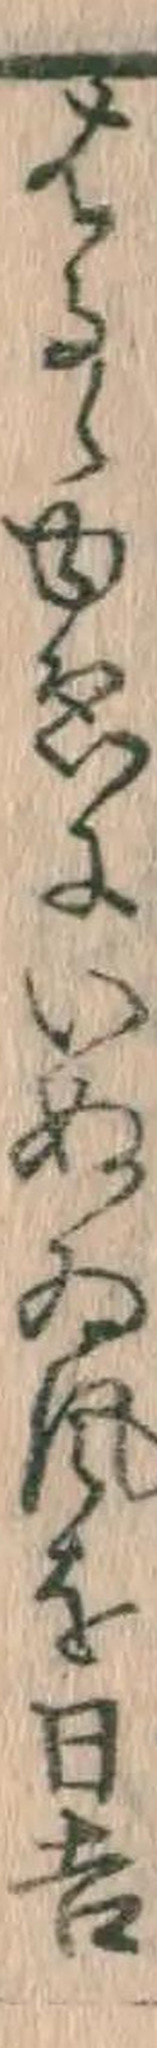はるゝゆゑにいぬゐ風を日吉
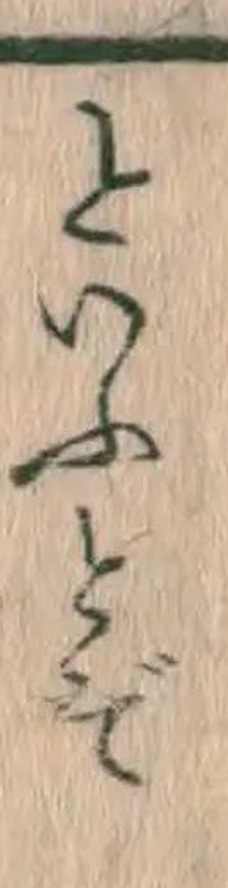といふとぞ
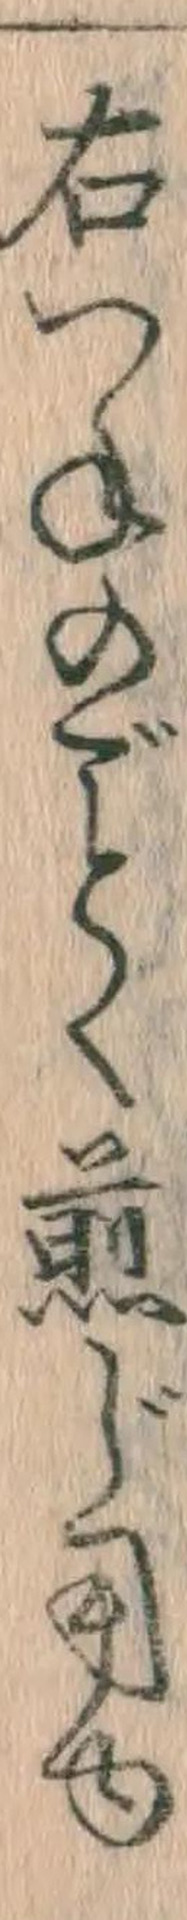右つねのごとく煎じ用ゆ
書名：広益秘事大全 3巻. [3]
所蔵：国立国会図書館 National Diet Library, JAPAN
